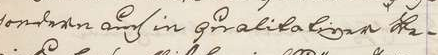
sondern auch in qualitativer Be-
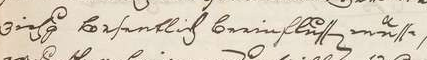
ziehung wesentlich beeinflussen müsse,
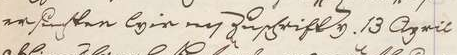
ersuchten wir mit Zuschrift v. 13 April
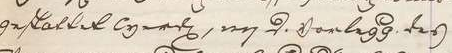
gestattet werden, mit d. Vorlegg. des
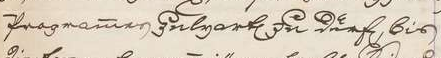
Programmes zuwarten zu dürfen, bis
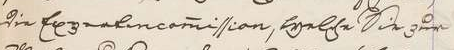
die Expertencommission, welche Sie zur
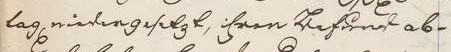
lagen niedergesetzt, ihren Befund ab-
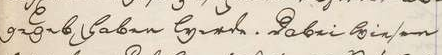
gegeben haben werde. Dabei wiesen
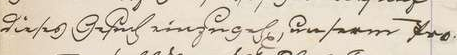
dieses Gesuch einzugehen, unserm Pro-
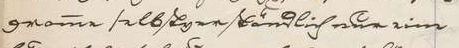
gramme selbstverständlich nur eine
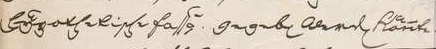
hypothetische Fass[un]g gegeben werden könnte.
